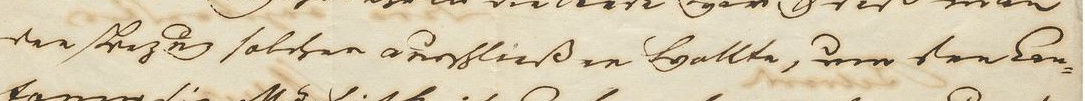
den Bezug solcher ausschließen wollte, um den Can-
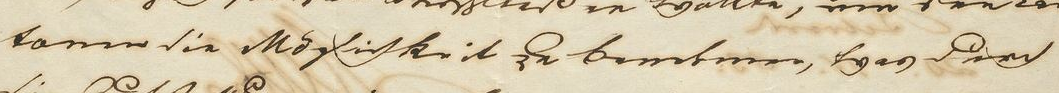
tonen die Möglichkeit zu benehmen, was durch
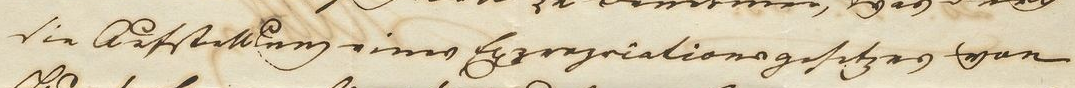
die Aufstellung eines Expropriationsgesetzes von
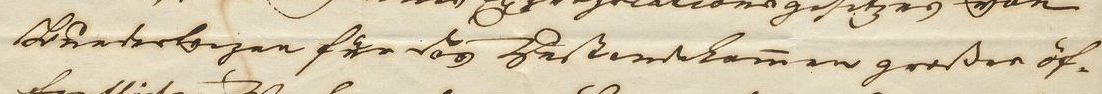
Bundeswegen für das Zustandekommen großer öf-
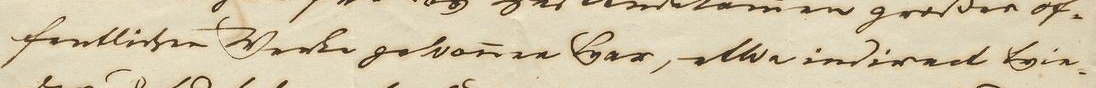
fentlicher Werke gewonnen war, etwa indirect wie-
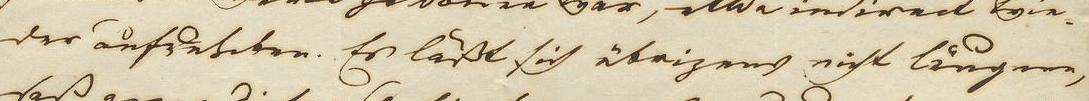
der aufzuheben. Es läßt sich übrigens nicht läugnen,
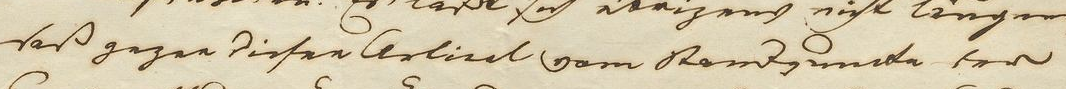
daß gegen diesen Articel vom Standpuncte der
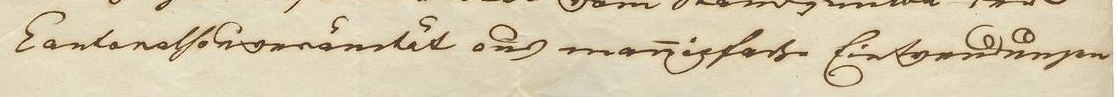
Cantonalsouveränität aus mannigfache Einwendungen
